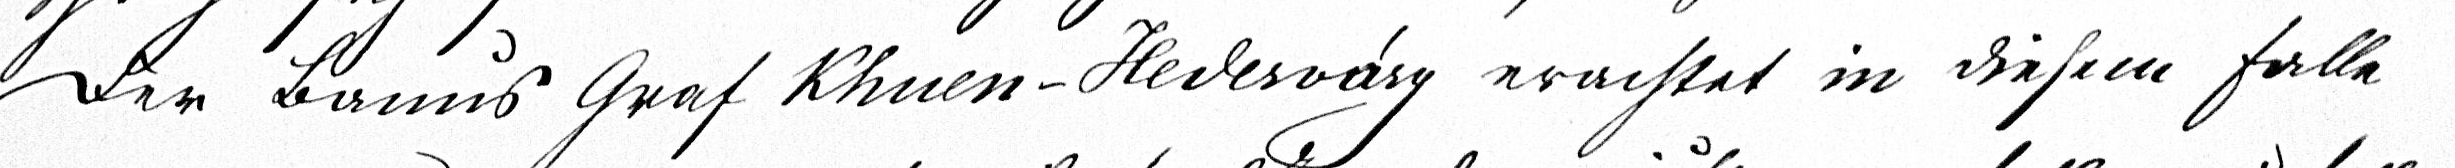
Der Banus Graf Khuen-Hedervárg erachtet in diesem Falle
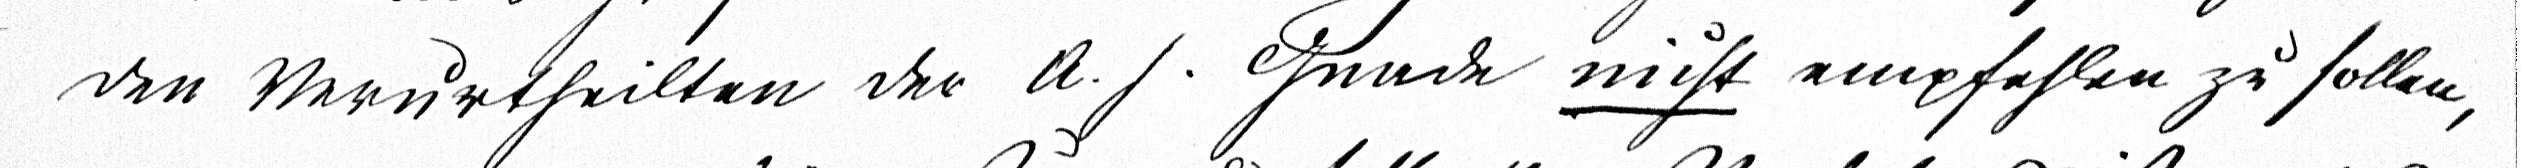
den Verurtheilten der A.h. Gnade nicht empfehlen zu sollen,
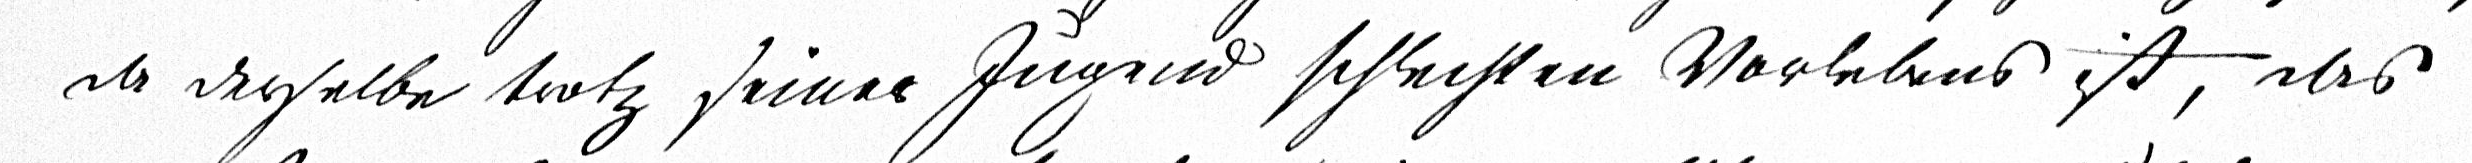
da derselbe trotz seiner Jugend schlechten Vorlebens ist, das
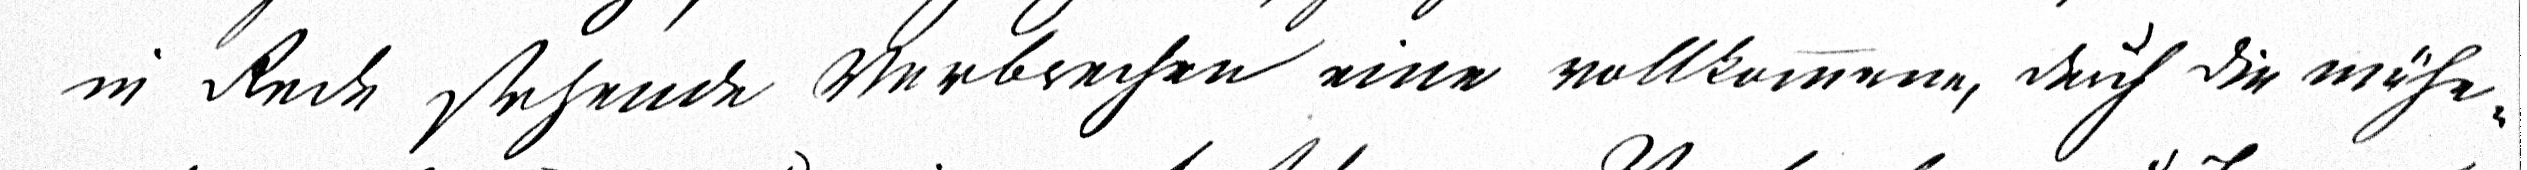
in Rede stehende Verbrechen eine vollkommene, durch die mühe¬
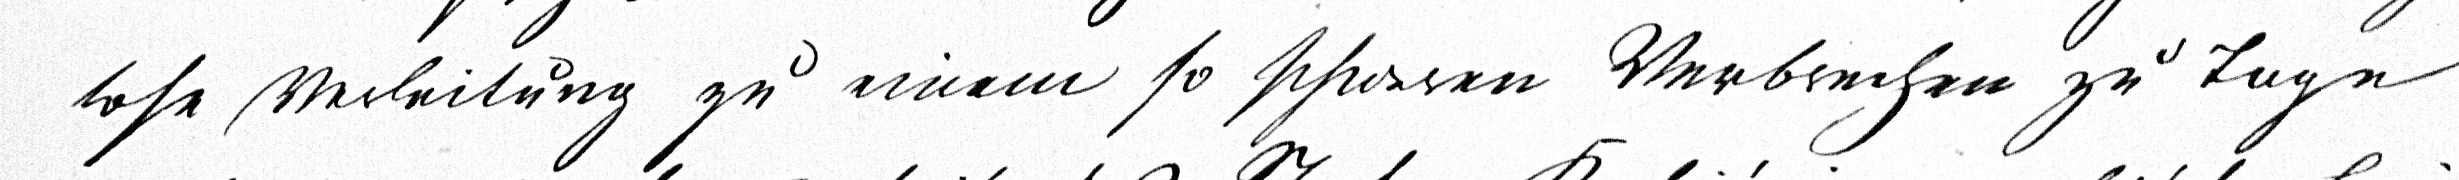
lose Verleitung zu einem so schweren Verbrechen zu Tage
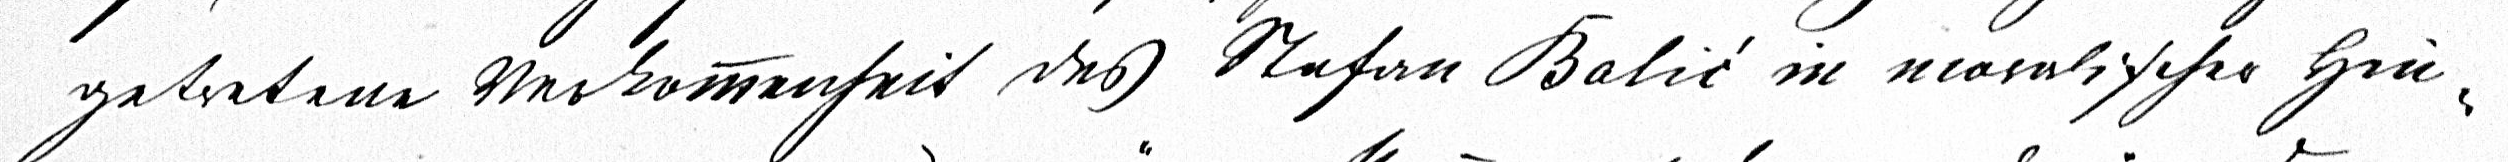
getretene Verkommenheit des Stefan Balić in moralischer Hin¬
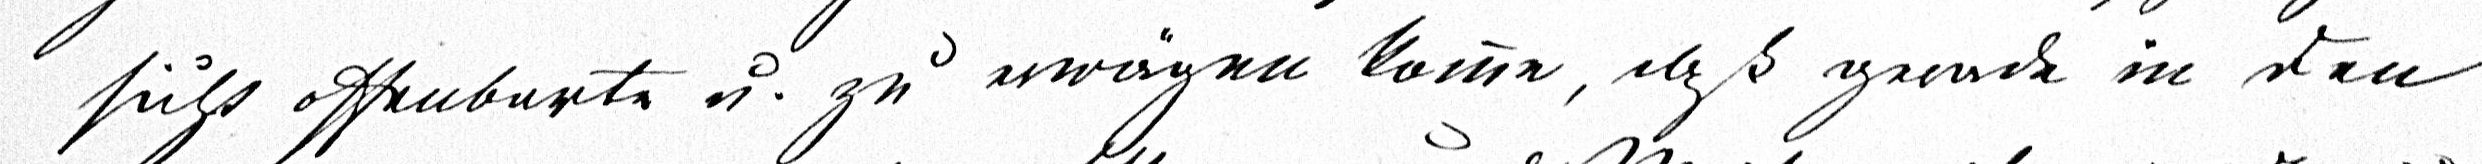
sicht offenbarte u. zu erwägen komme, daß gerade in den
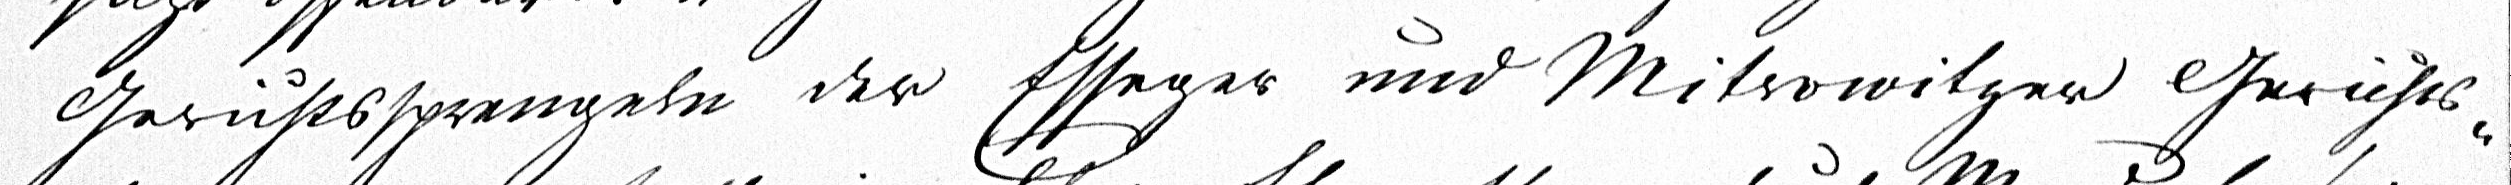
Gerichtssprengeln der Esseger und Mitrowitzer Gerichts¬
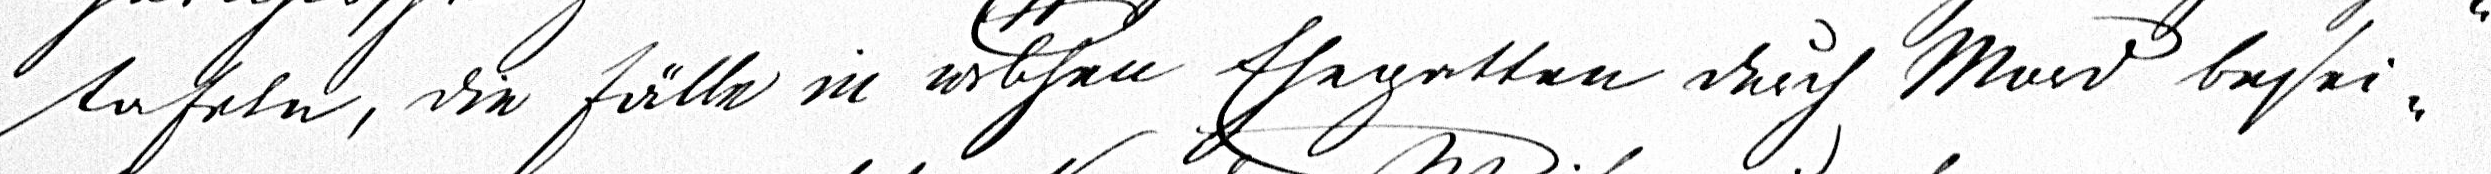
tafeln, die Fälle in erbhen Ehegatten durch Mord besei¬
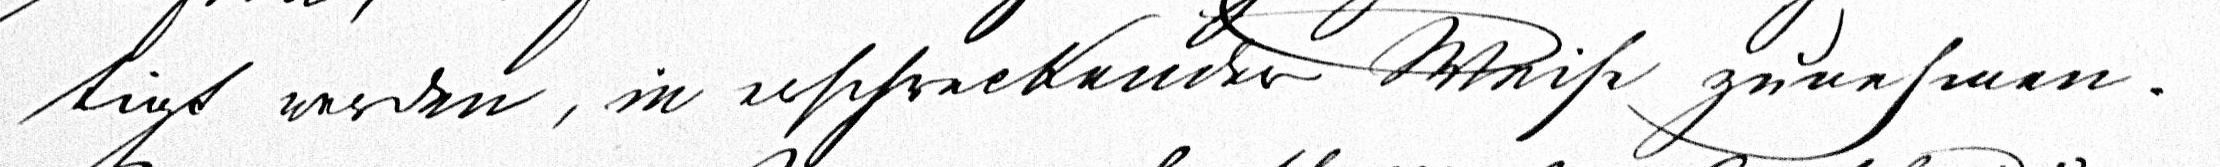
tigt werden, in erschreckender Weise zunehmen.
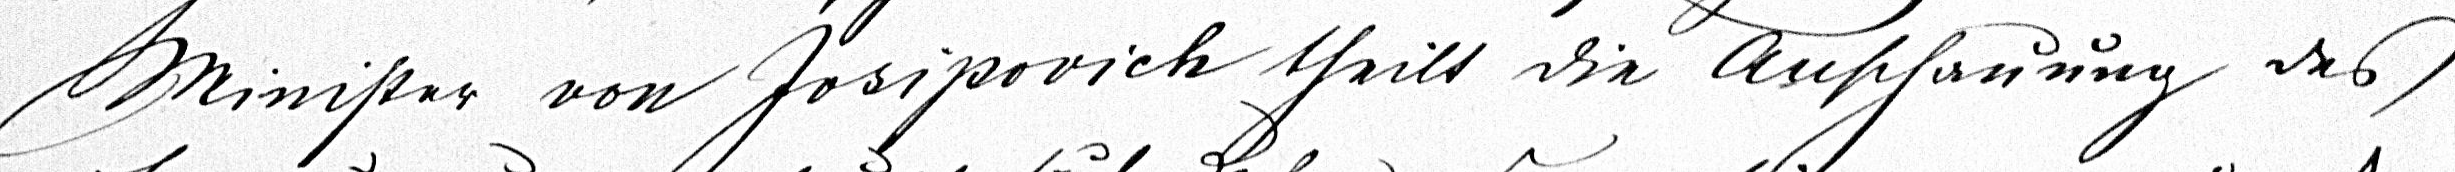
Minister von Josipovich theilt die Anschauung des
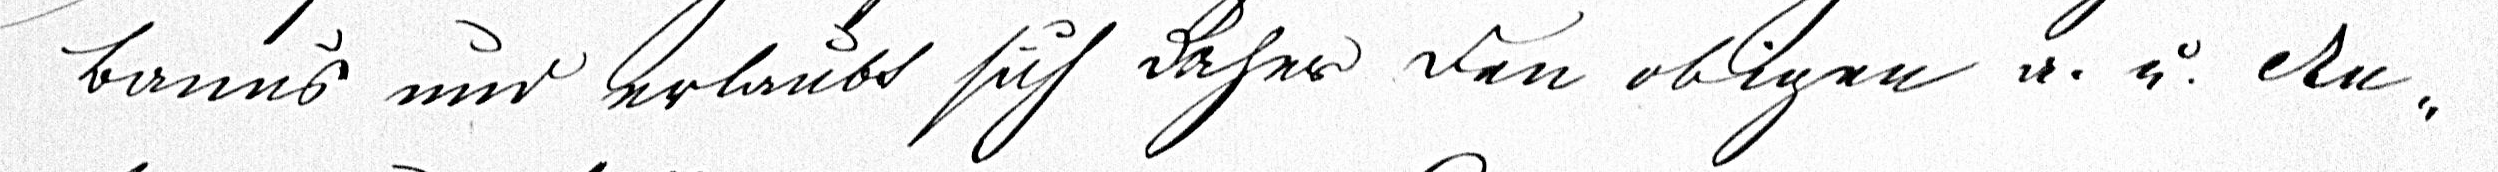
Banus und erlaubt sich daher den obigen a. u. An¬
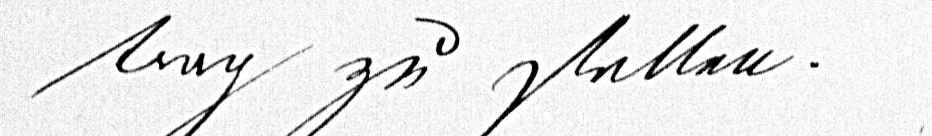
trag zu stellen.
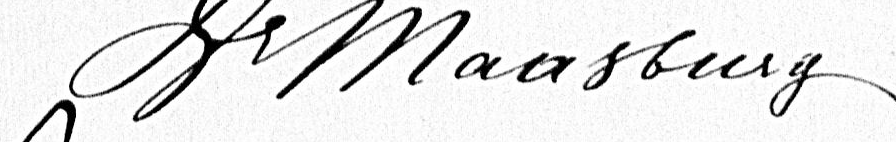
Dr Maasburg
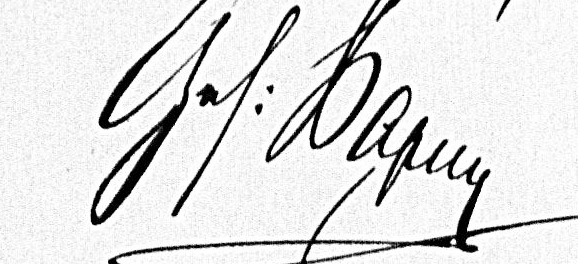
Ges: xx
